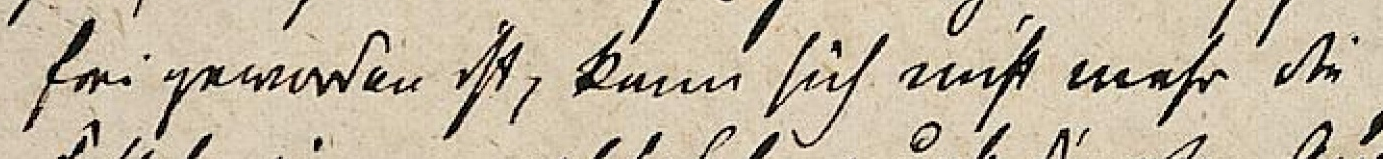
freigeworden ist, kann sich nicht mahr, die
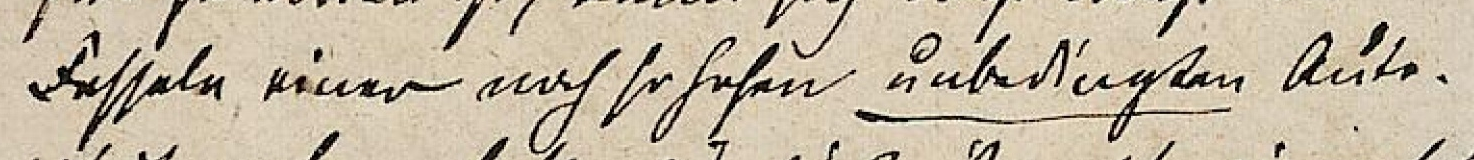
Fesseln einer noch so hohen unbedingen Auto¬
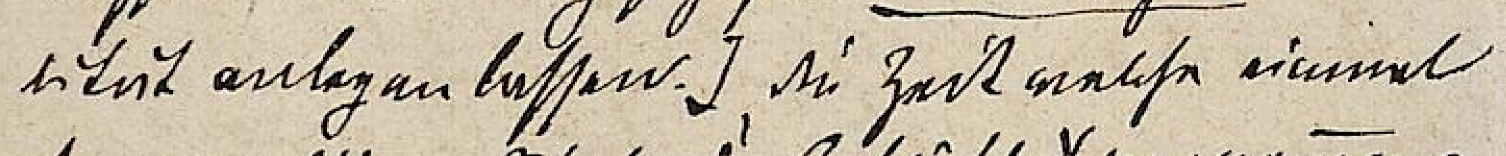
rität anlegen lassen.] die Zeit welche einmal
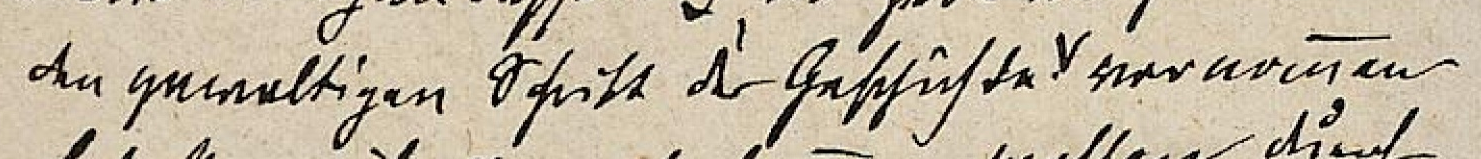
den gewaltigen Schritt der Geschichte vernomen
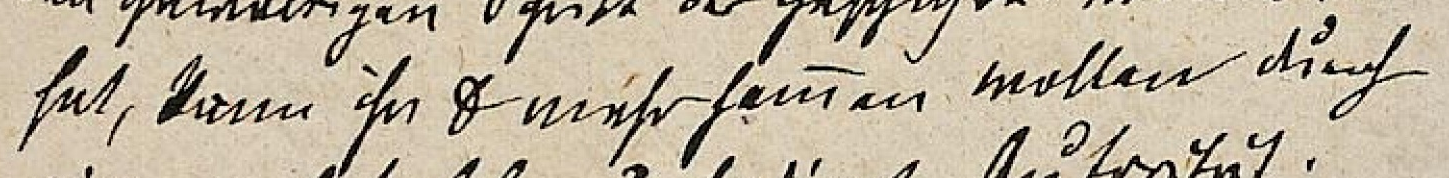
hat, kann ihn o mehr hemen wollen durch
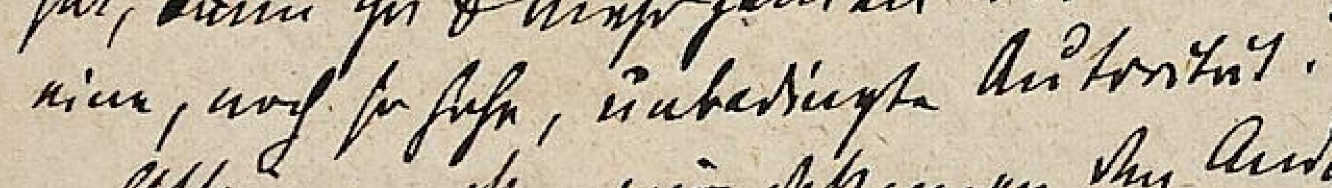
eine, noch so hohe, unbedingte Autorität.
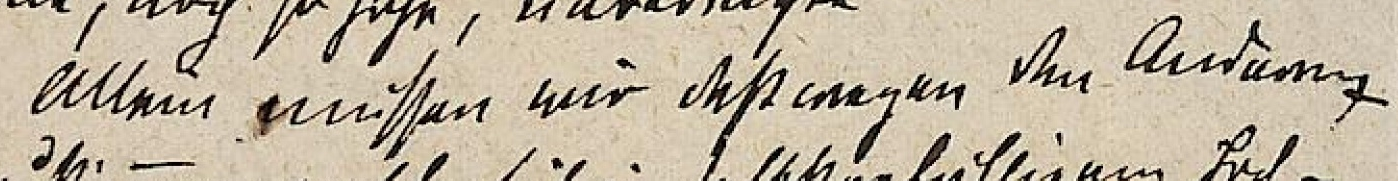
Allein müssen wir deßwegen den Anderen
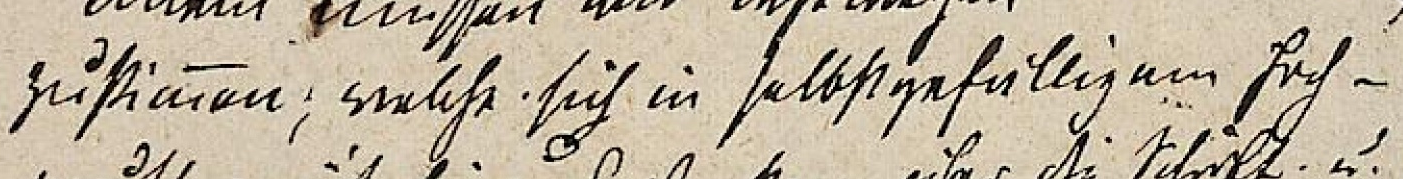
zustimen, welche sich in selbstgefälligem Hoch¬
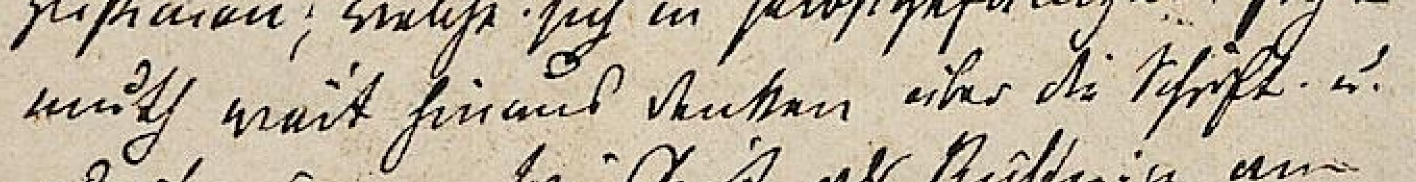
muth weit hinaus denken über die Schrift u.
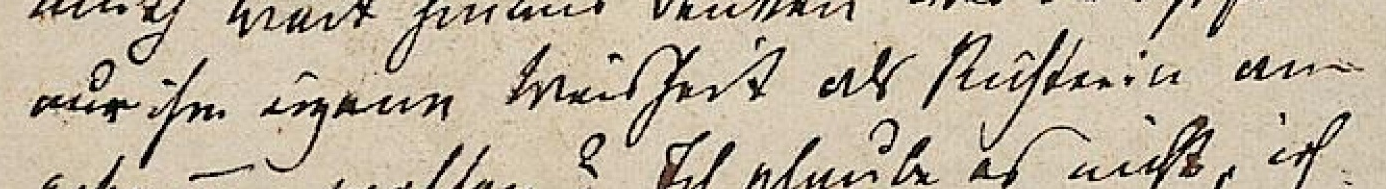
nur ihre eigene Weisheit als Richterin am
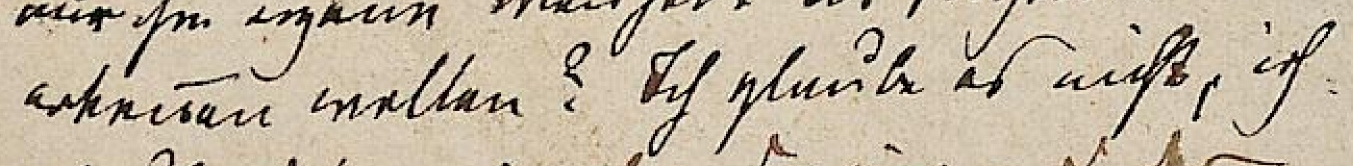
erkenen wollen? Ich glaube es nicht, ich
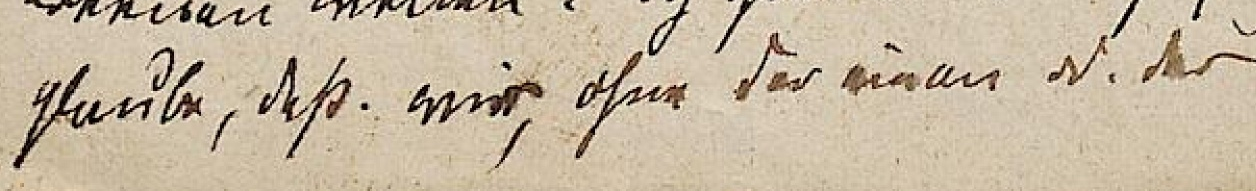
glaube, daß. wir, ohne der einen od. der
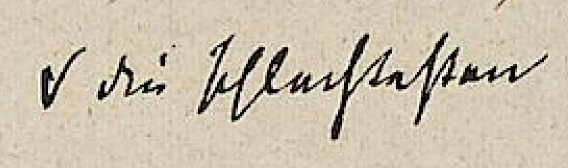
V die schlechtesten,
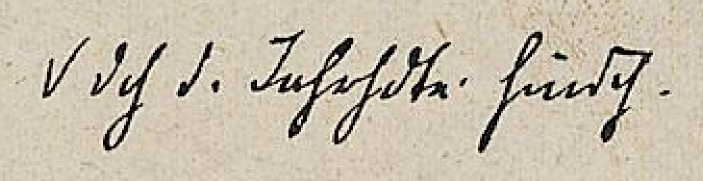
V dch d. Jahrhdte. hindch.
